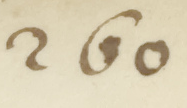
260
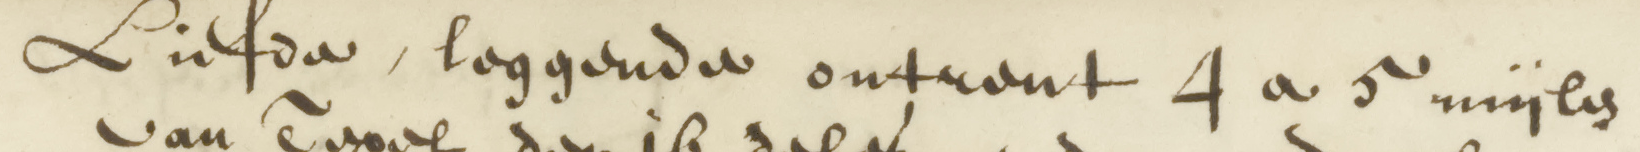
Liefde, leggende ontrent 4 a 5 mijlen
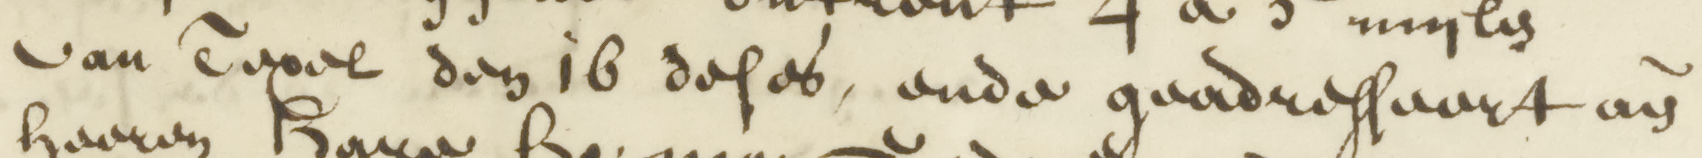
van Texel den 16 deses, ende geadresseert aen
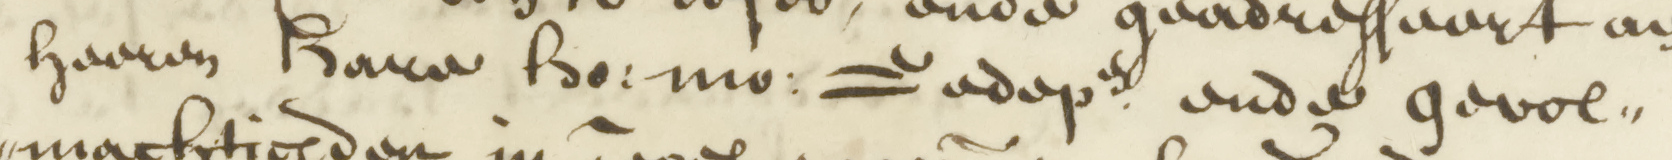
heeren hare Ho: Mo: Gedepen ende gevol„
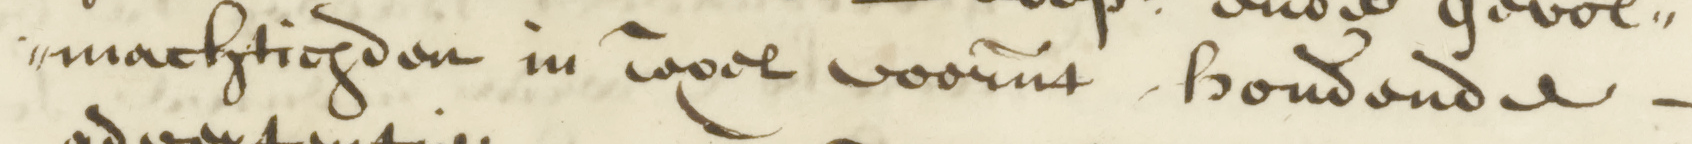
machtichden in Texel voornt, houdende
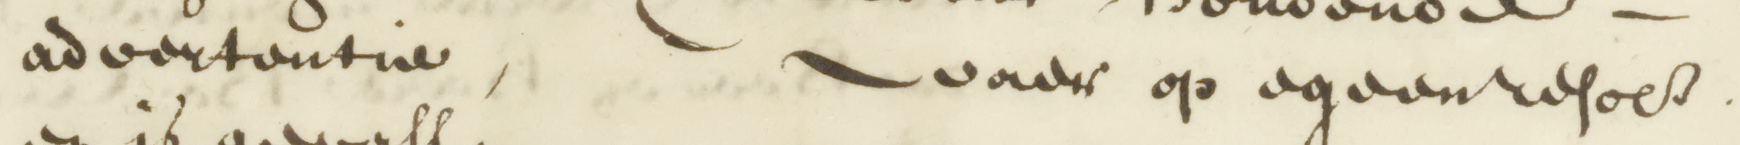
advertentie. Waer op egeen resol
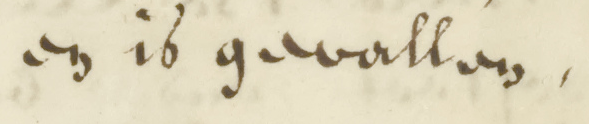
en is gevallen.
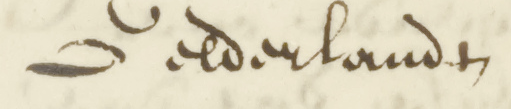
Gelderlandt
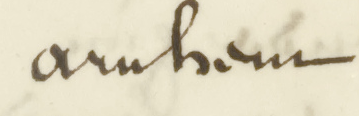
Arnhem
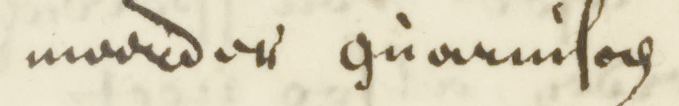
meerder guarnisoen
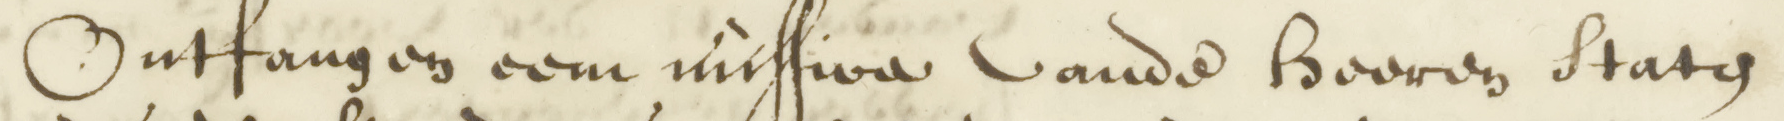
Ontfangen een missive vande heeren Staten
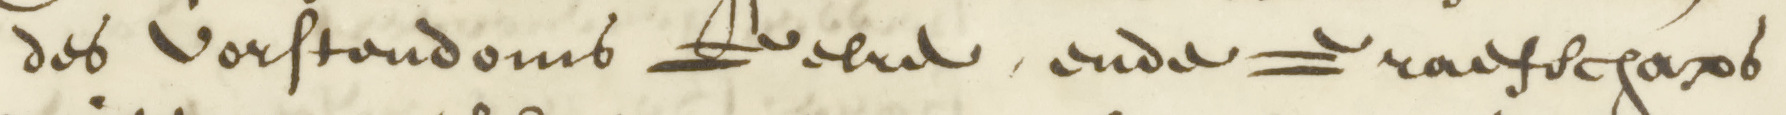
des vorstendoms Gelre, ende Graefschaps
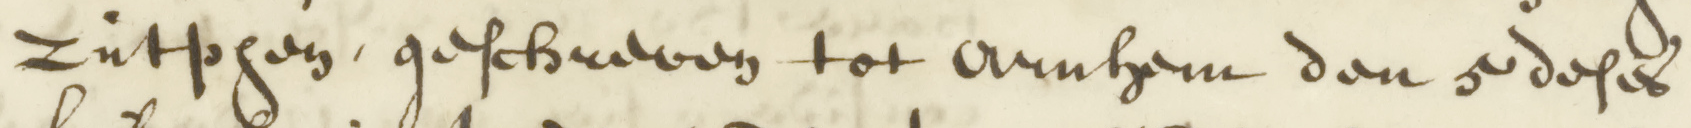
Zutphen, geschreven tot Arnhem den 5 deses
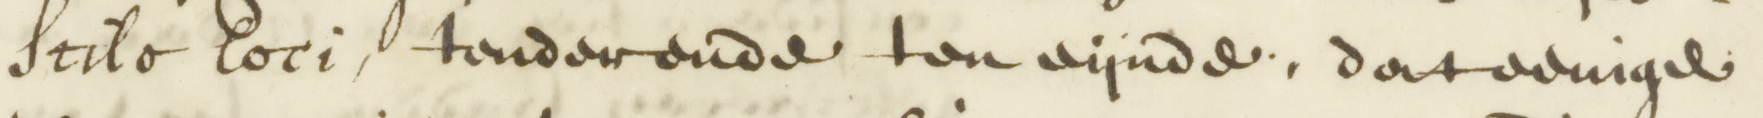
stilo loci, tenderende ten eijnde, dat eenige
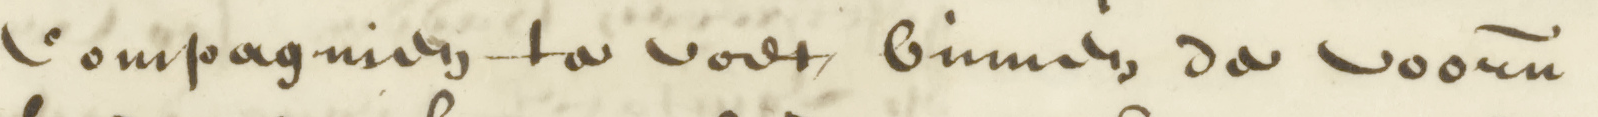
Compagnien te voet binnen de voorn.
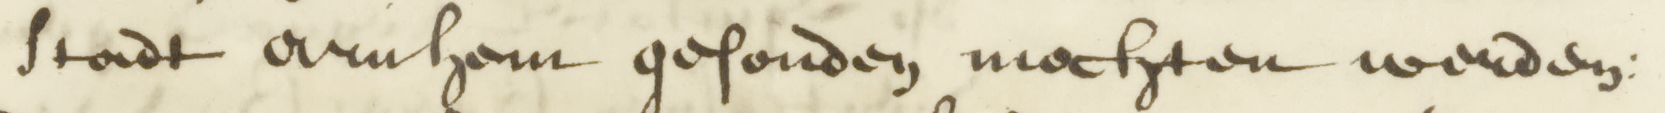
stadt Arnhem gesonden mochten werden:
